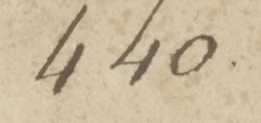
440.
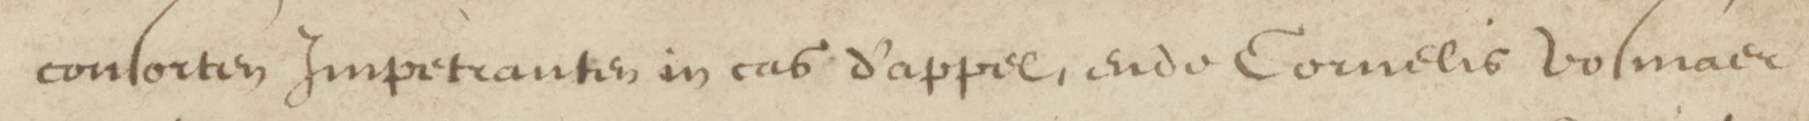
consorten Impetranten in cas d'appel, ende Cornelis vosmaer
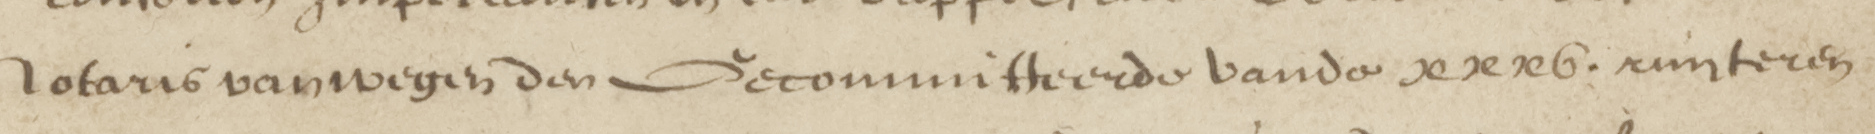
Notaris van wegen den Gecommitteerde vande xxxv. ruyteren
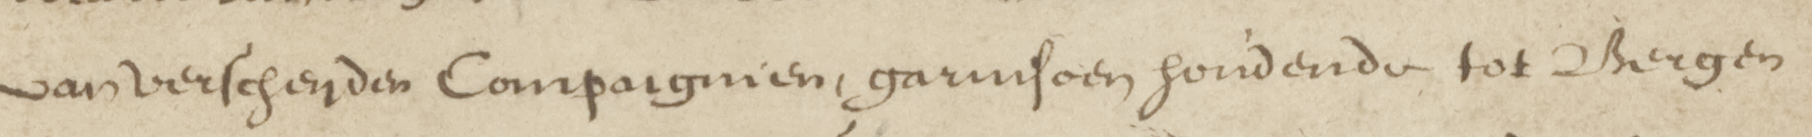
van verscheyden Compaignien, garnisoen houdende tot Bergen
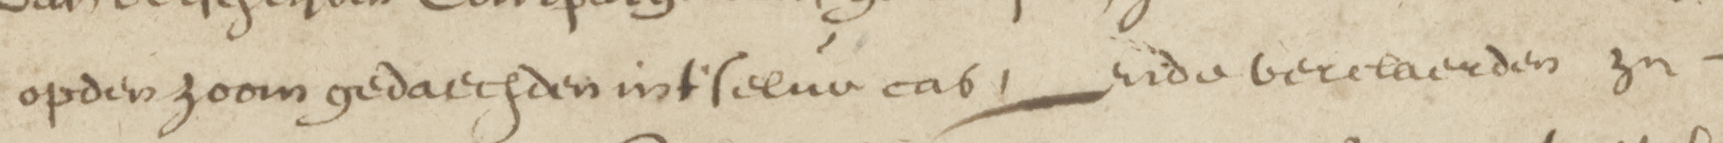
opden zoom gedaechden in t'selue cas, ende verclaerden zy
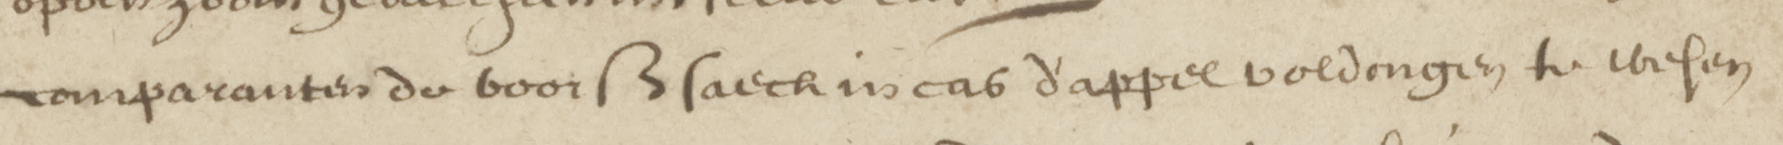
comparanten de voors saeck in cas d'appel voldongen te wesen
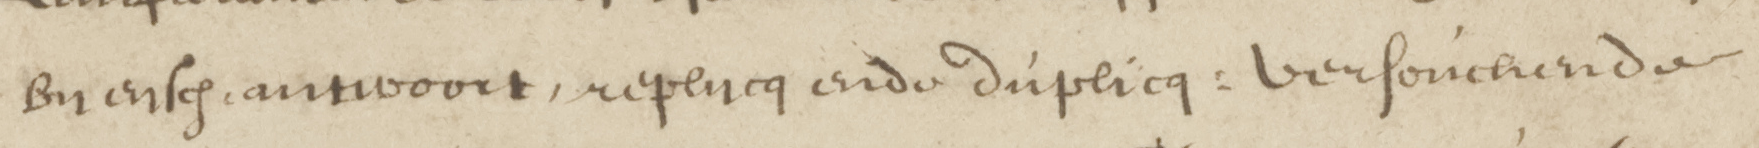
by eysch, antwoort, replycq ende duplicq: Versouckende
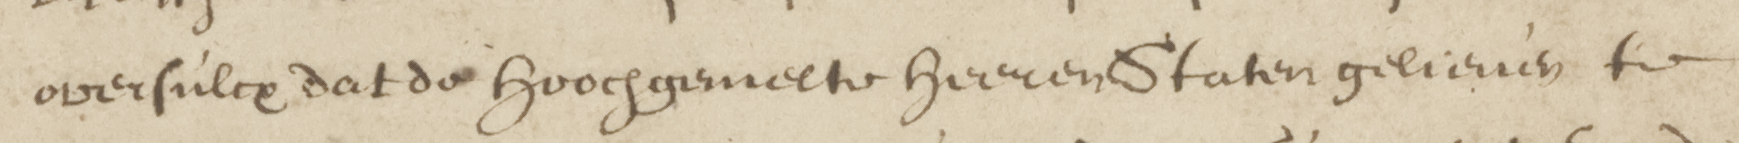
oversulcx dat de hoochgemelte heeren Staten gelieuen te
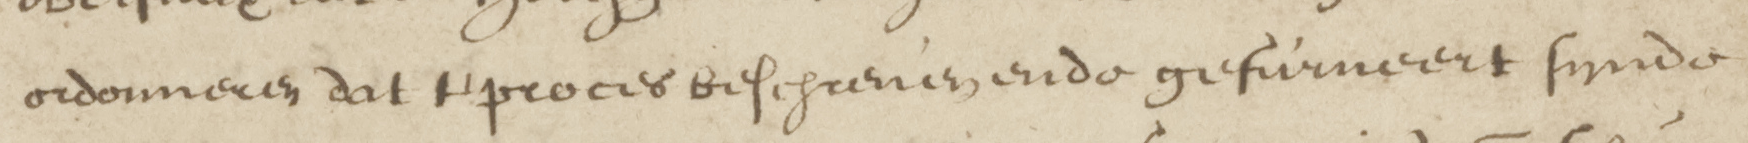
ordonneren dat t' proces beschreuen ende gefurneert synde,
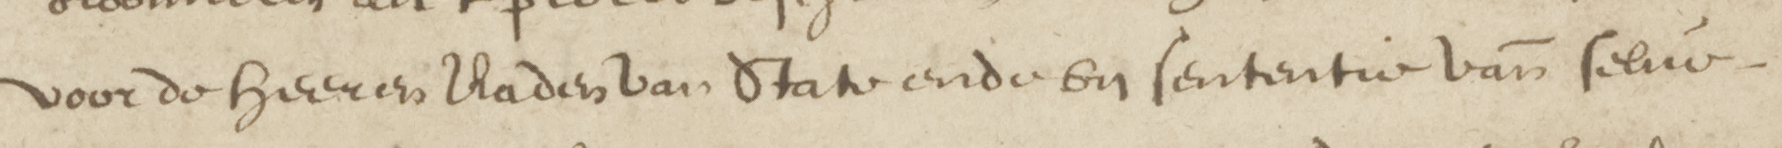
voor de heeren Raden van State ende by sententie van selue
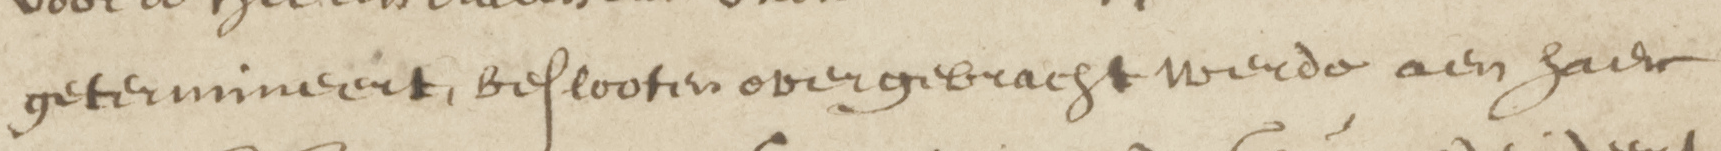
getermineert, beslooten overgebracht werde aen haer
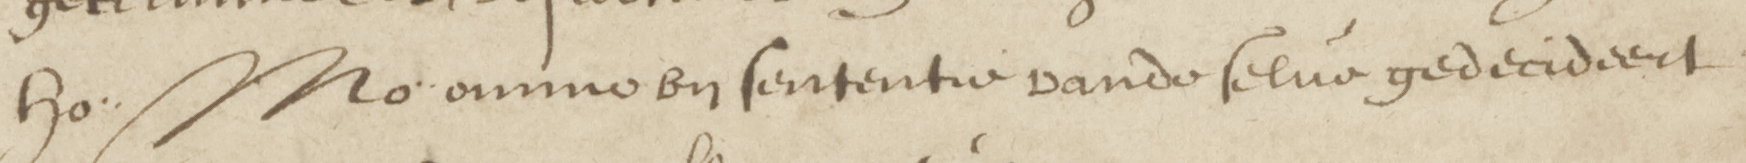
ho:Mo: omme by sententie vande selue gedecideert
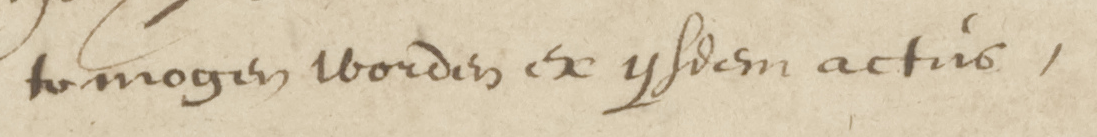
te mogen worden ex ysdem actus.
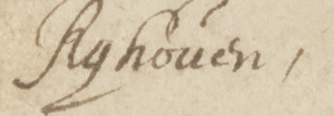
Ryhouen.
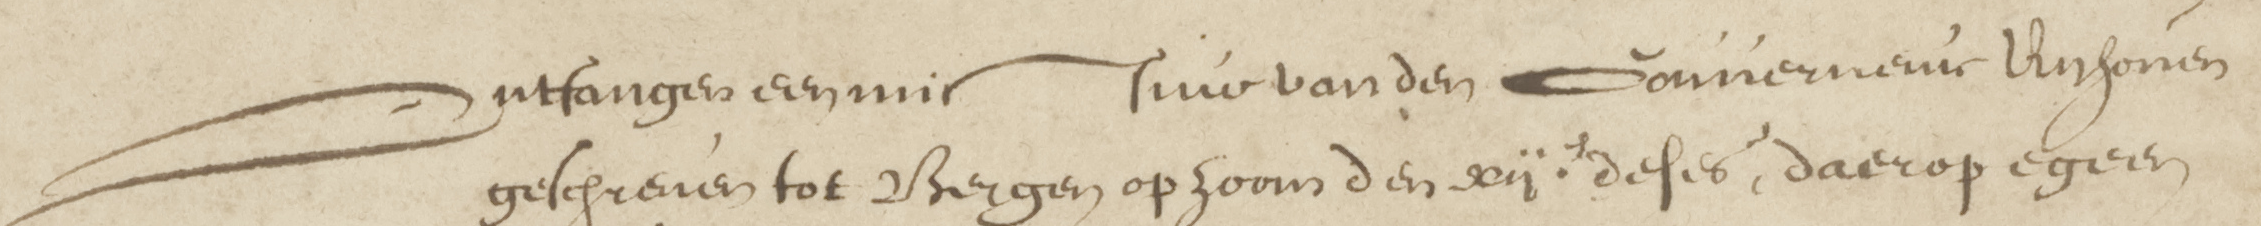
Ontfangen een missiue van den Gouuerneur Ryhouen
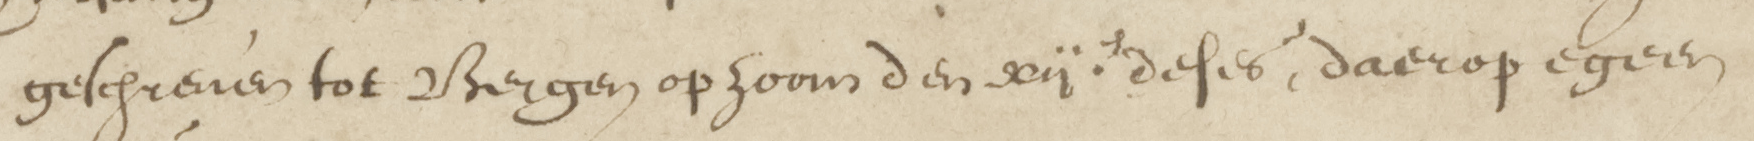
geschreuen tot Bergen op zoom den xijen. deses, daerop egeen
